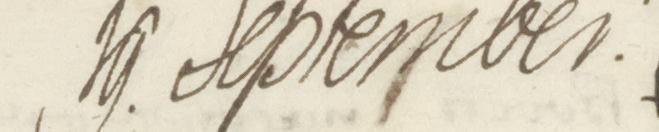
19. September.
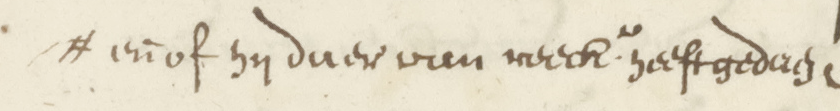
# enof hy daer van reecke heeft gedaen,
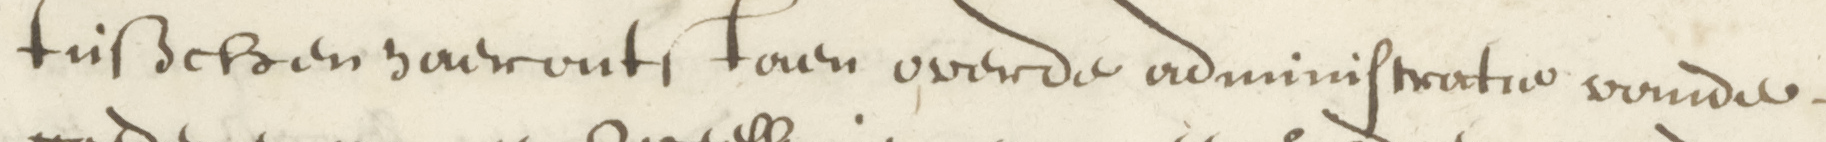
tusschen haer ontstaen overde administratie vande
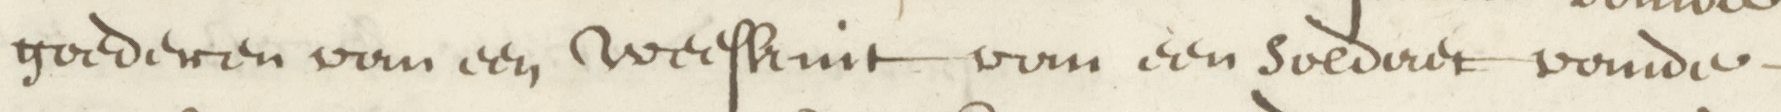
goederen van een weeskint van een soldaet vande
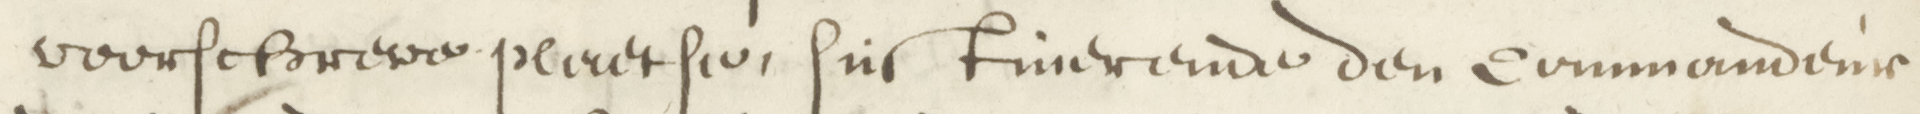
voorschreve plaetse, sustinerende den Commandeur
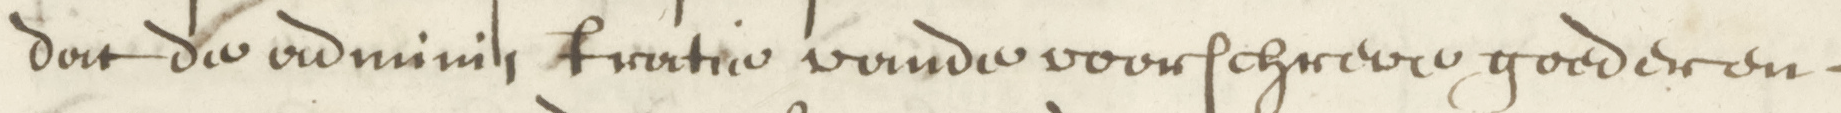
dat de administratie vande voorschreve goederen
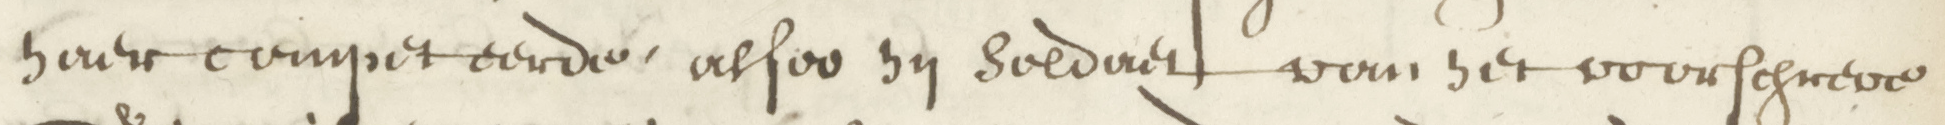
haer competeerde, alsoo hy soldaet van het voorschreve
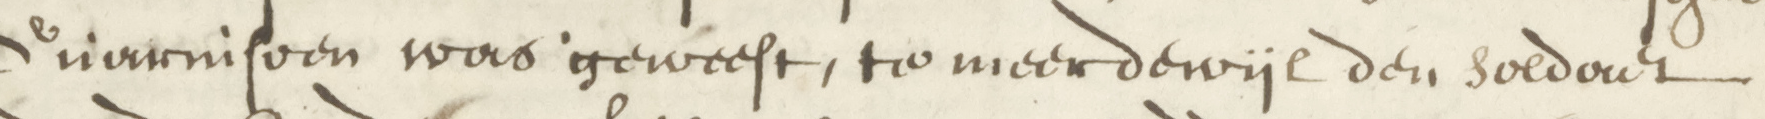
Guarnisoen was geweest, te meer dewijl den soldaet
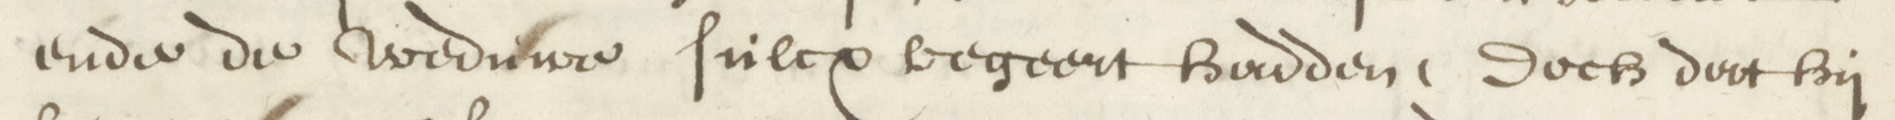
ende de weduwe sulcx begeert hadden, Doch dat hy
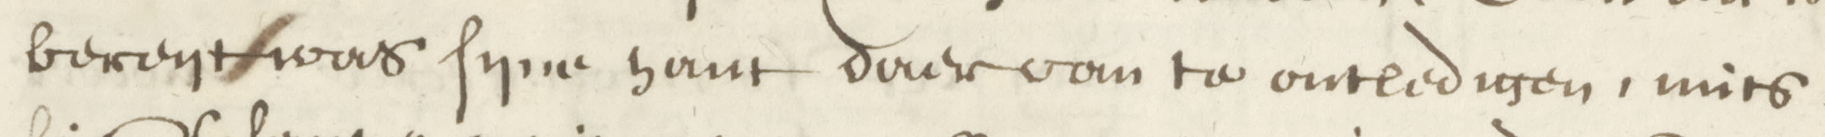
bereyt was syne hant daer von te ontledigen, mits
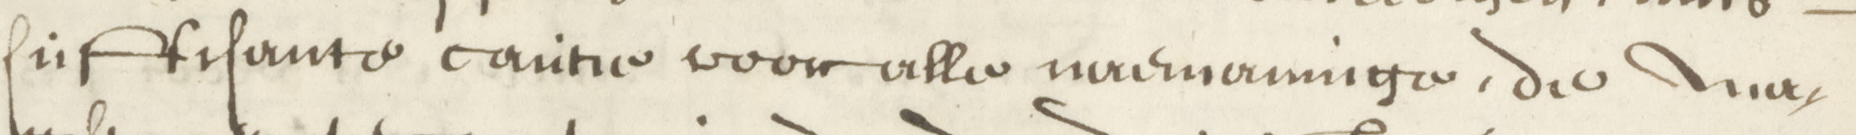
suffisante cautie voor alle naemanningen, de Ma,,
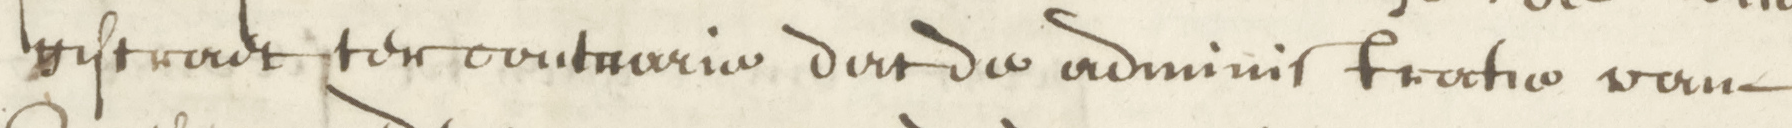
gistraet ter contrarie dat de administratie van
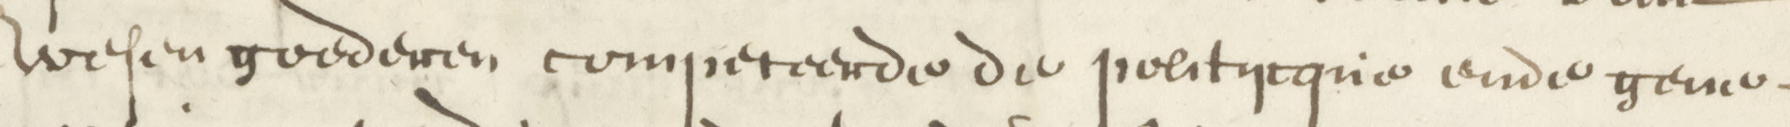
wesen goederen competeerde de politycque ende gene
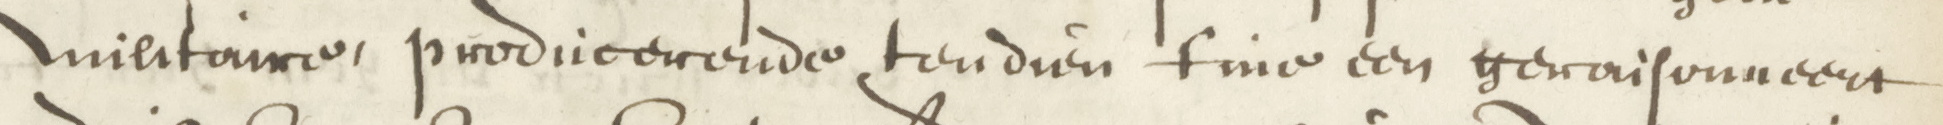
militaire, producerende ten dien fine een geraisonneert
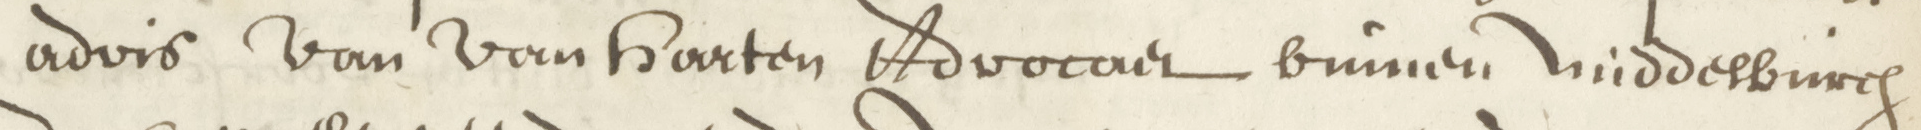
advis van van Harten Advocaet binnen Middelburch
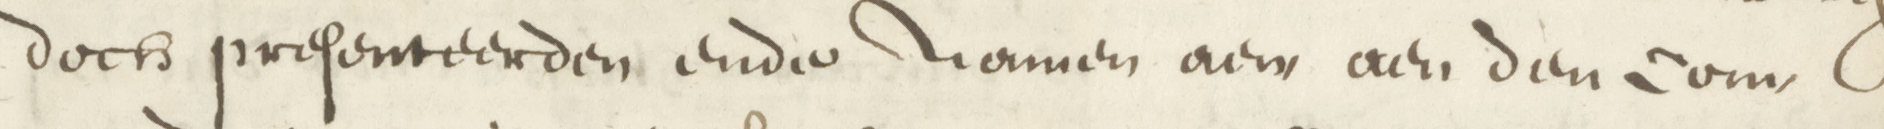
doch presenteerden ende namen aen, aen den Com,
